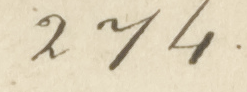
274
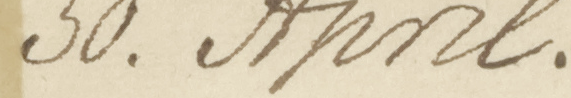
30 April
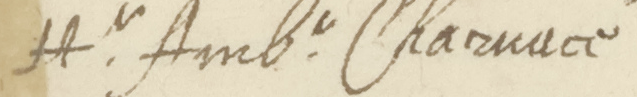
Hr Ambr Charnace
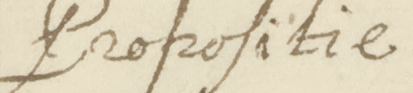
Propositie
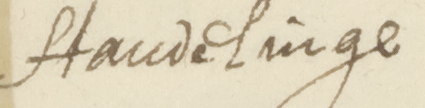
Handelinge
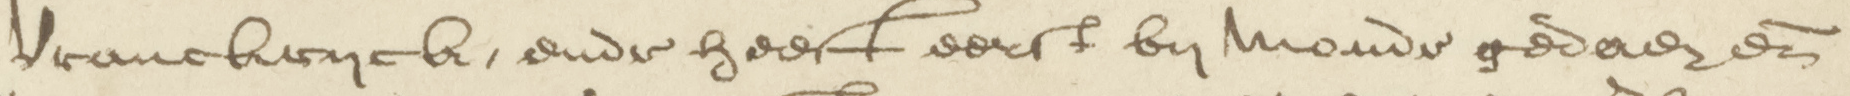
Vranckryck, ende heeft eerst bij monde gedaen en
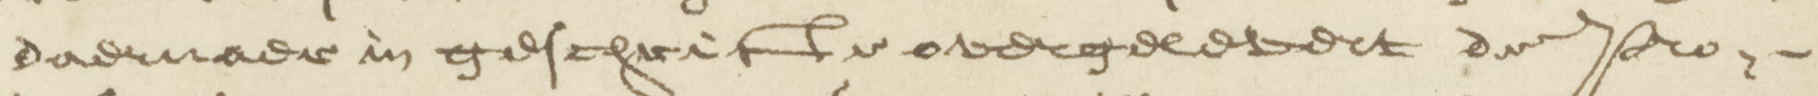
daernaer in geschrifte overgelevert de pro„
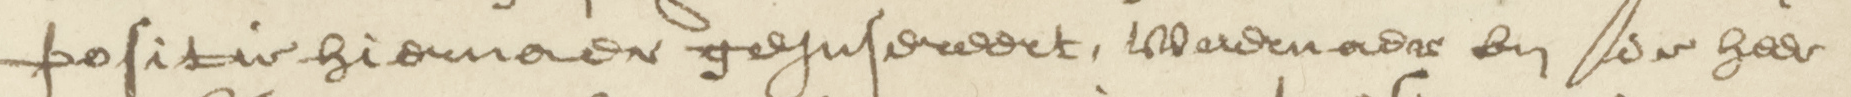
positie hiernaer geinsereert, waernaer bij de heer
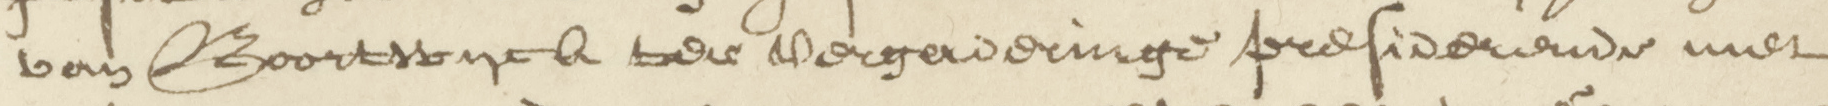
van Noortwyck ter vergaderinge presiderende met
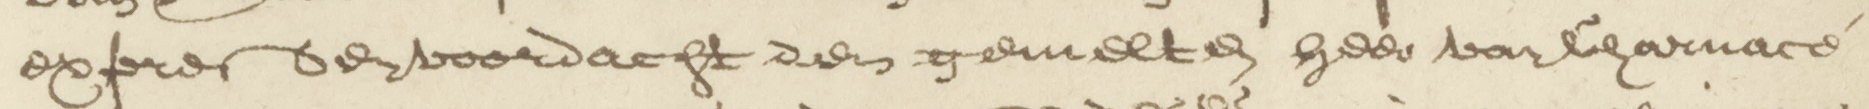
expressen voordacht den gemelten heer van Charnacé
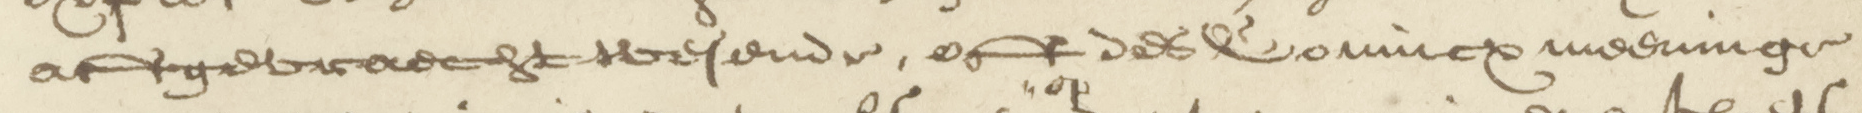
affgevraecht wesende, off des Conincx meeninge
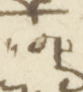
,,op
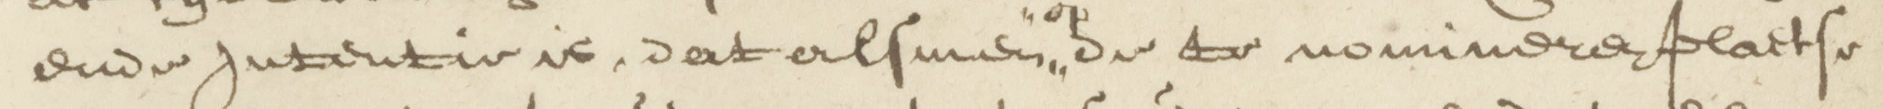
ende intentie is, dat alsmen ,, de te nomineren plaetse
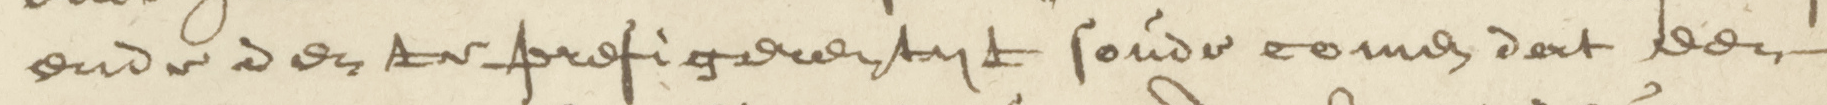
ende den te prefigeren tyt soude comen dat een
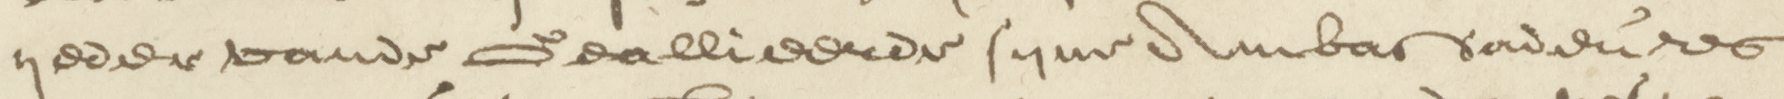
yeder vande Geallieerde syne Ambassadeurs
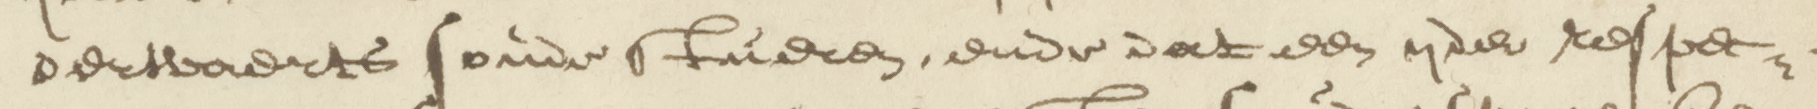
derwaerts soude stueren, ende dat een yder respec„
